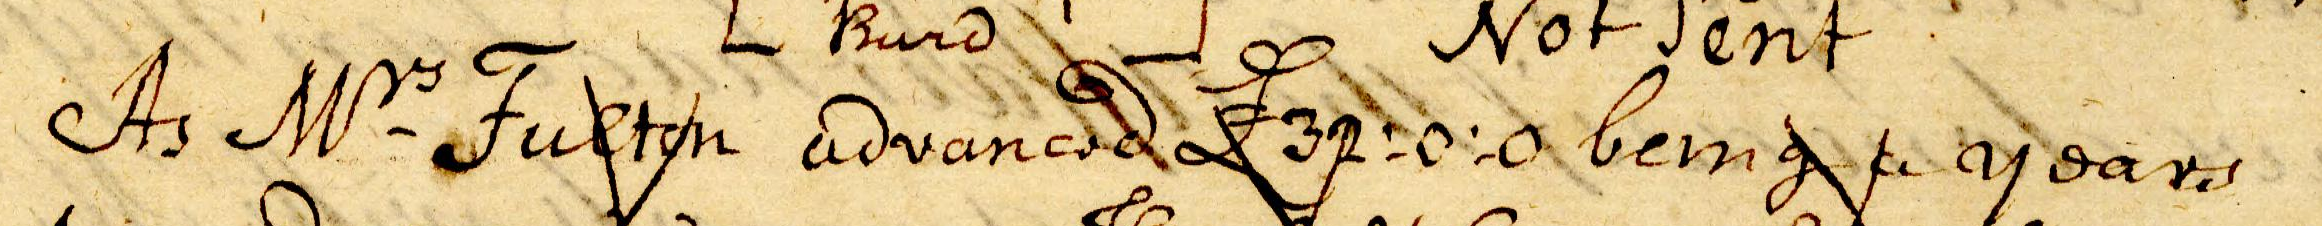As M^rs Fulton advanced £32:0:0 being a Years
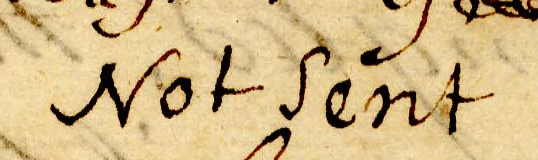Not Sent
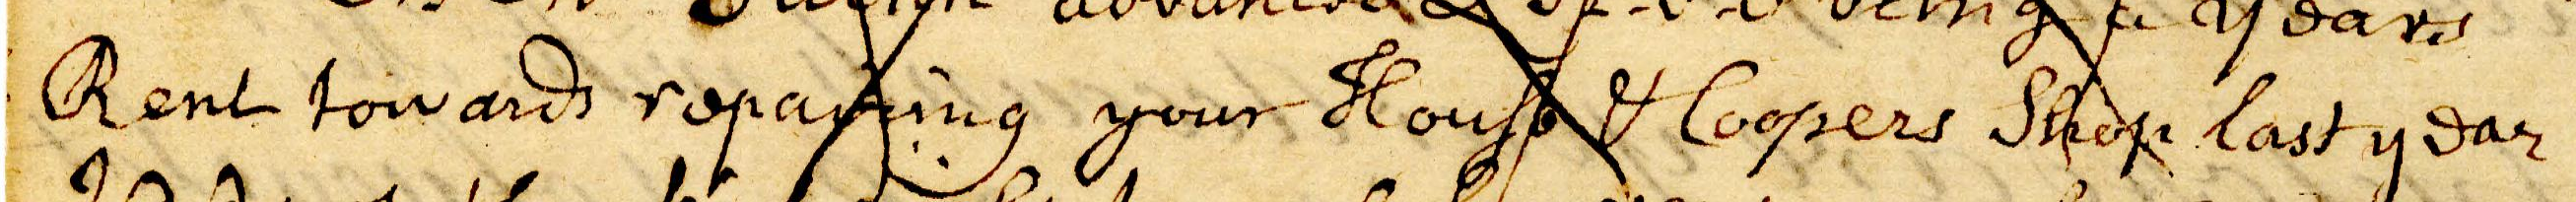Rent towards repairing your House & Coopers Shop last year
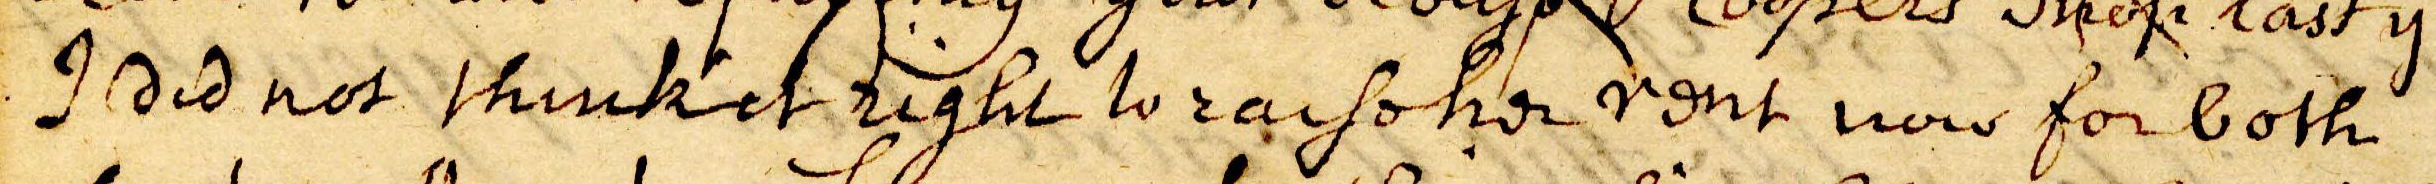I did not think it right to raise her rent now for both
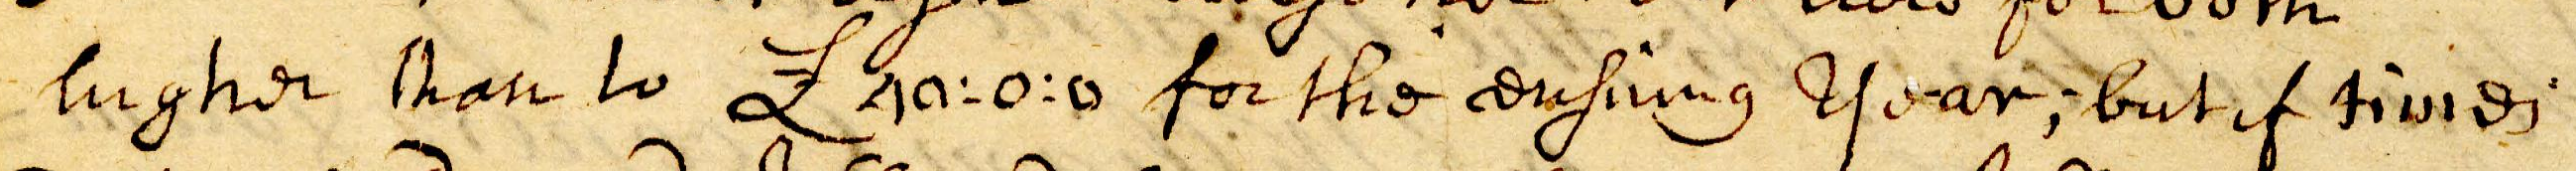higher than to £40:0:0 for the ensuing Year; but it times
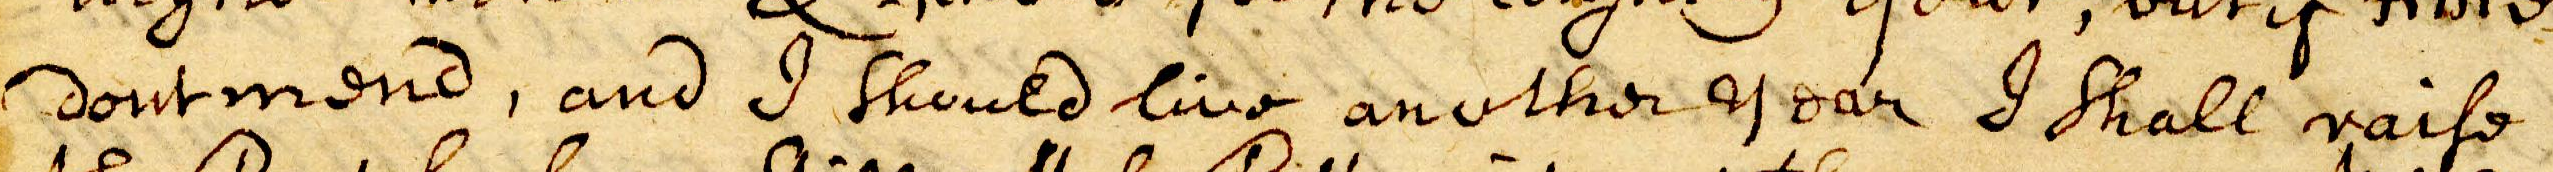dont mend, and I Should live another Year I Shall raise
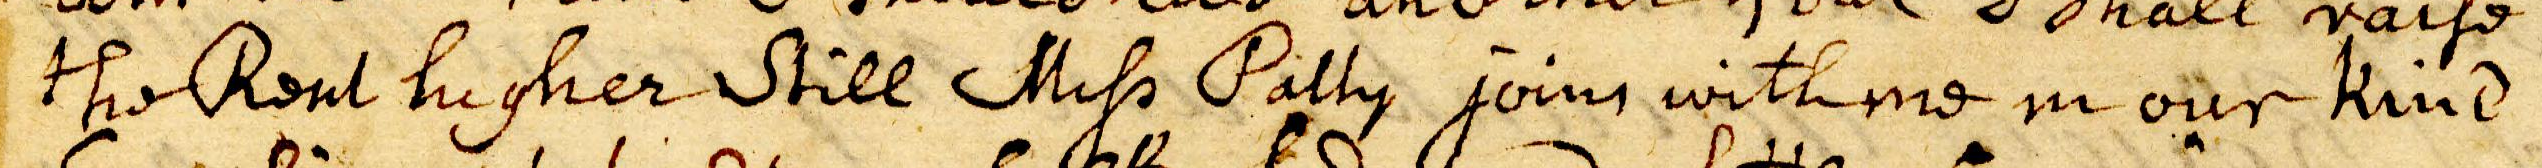the Rent higher Still Miss Pally joins with me in our kind
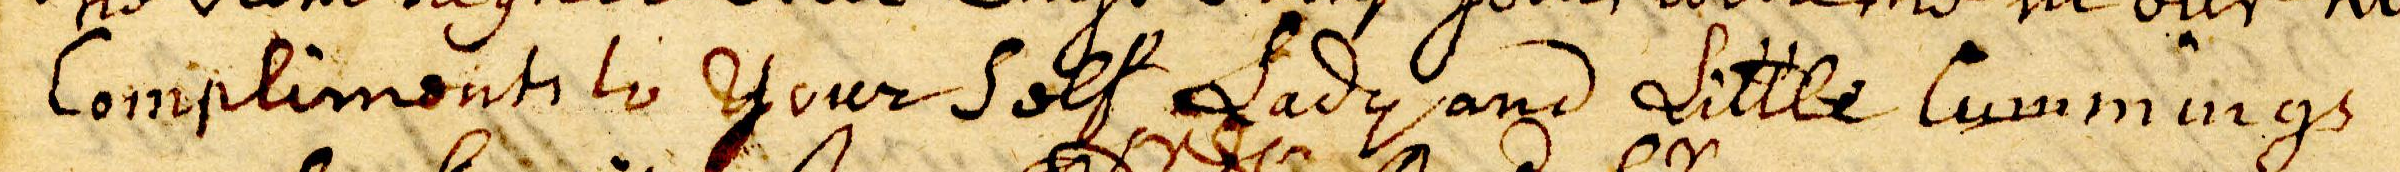Compliments to Your Self Lady and Little Cummings
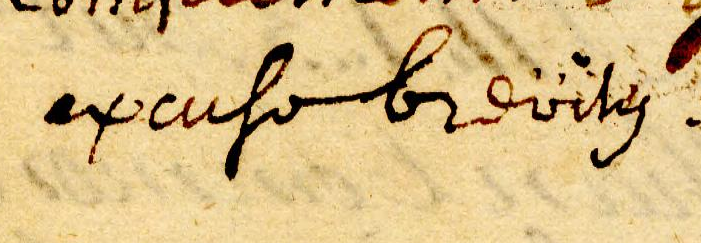excuse brevity
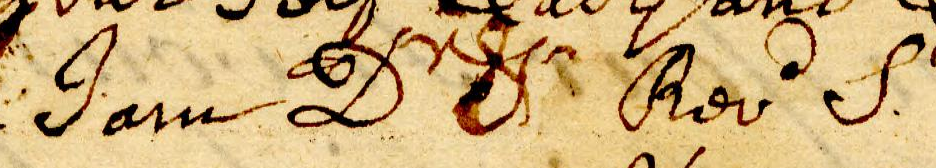I am D^r Rev^d S.^r
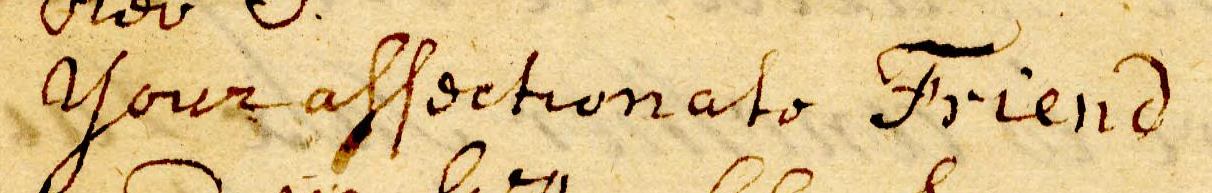Your affectionate Friend
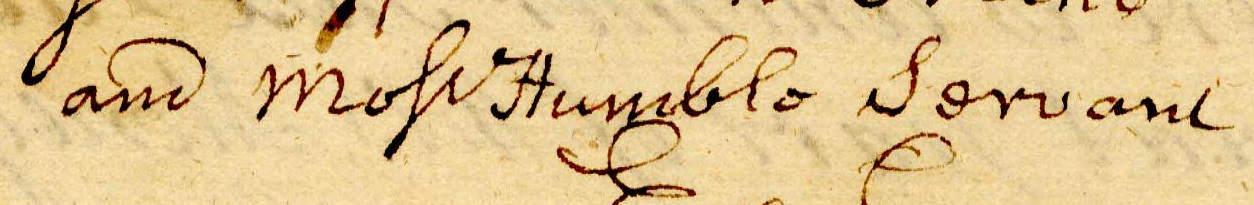and Most Humble Servant
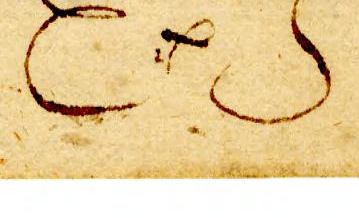E+S
